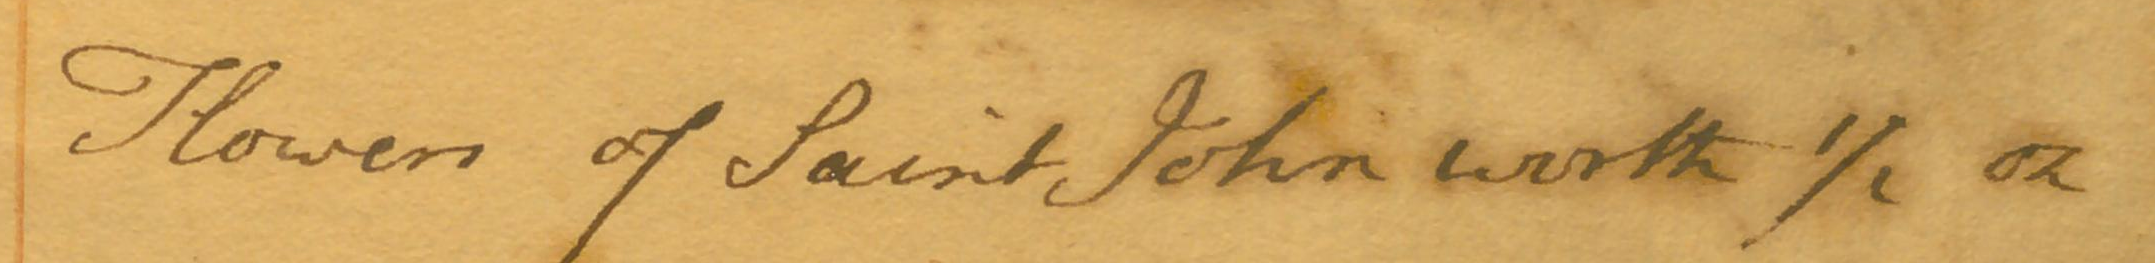Flowers of Saint John worth 1/2 oz
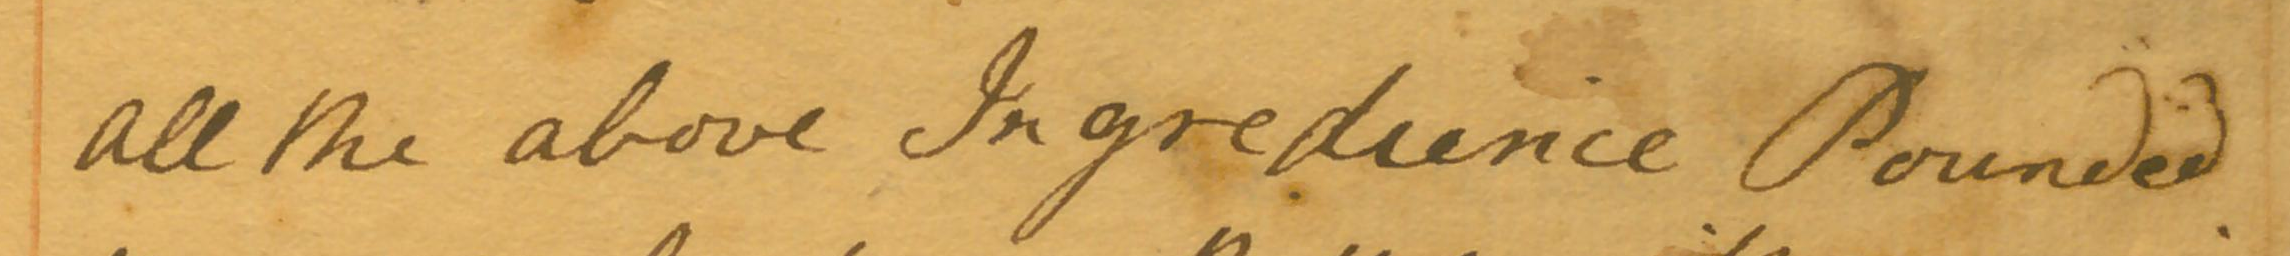all the above Ingredience Pounded
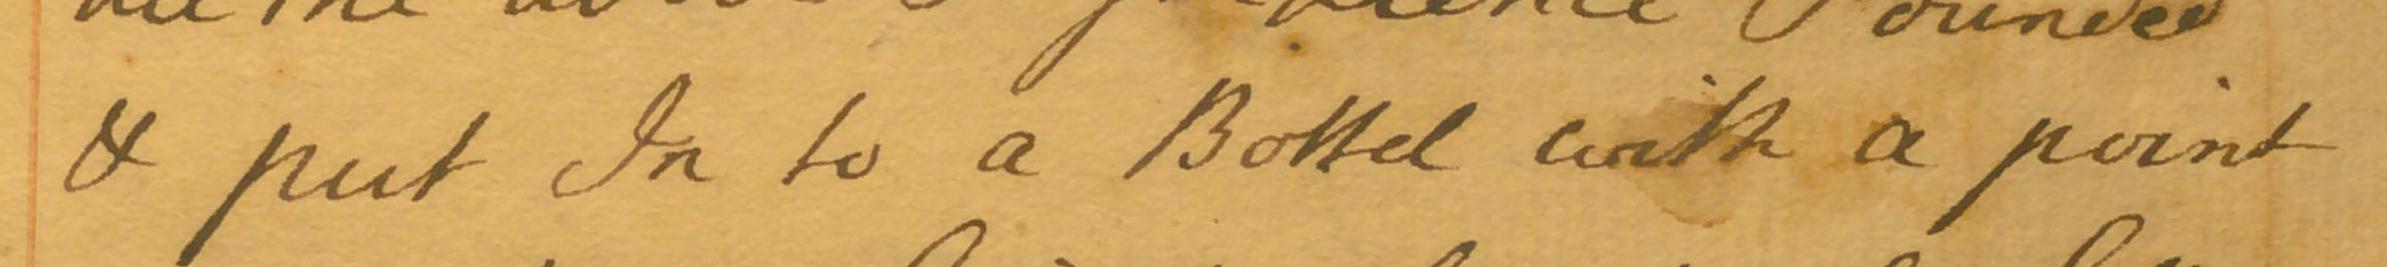& put In to a Bottel with a point
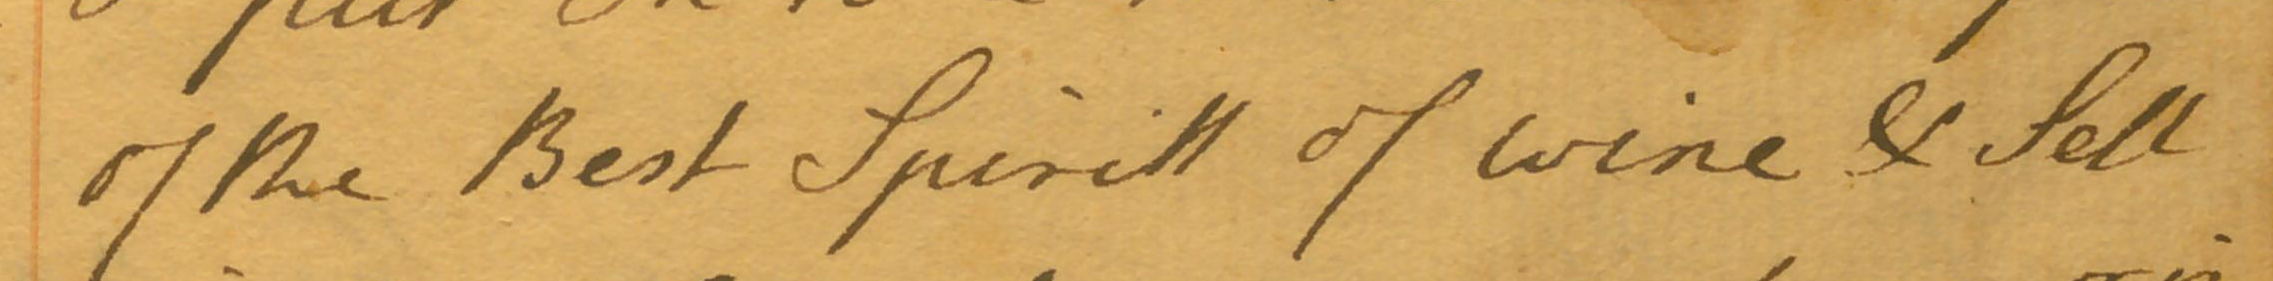of the Best Spiritt of wine & Sett
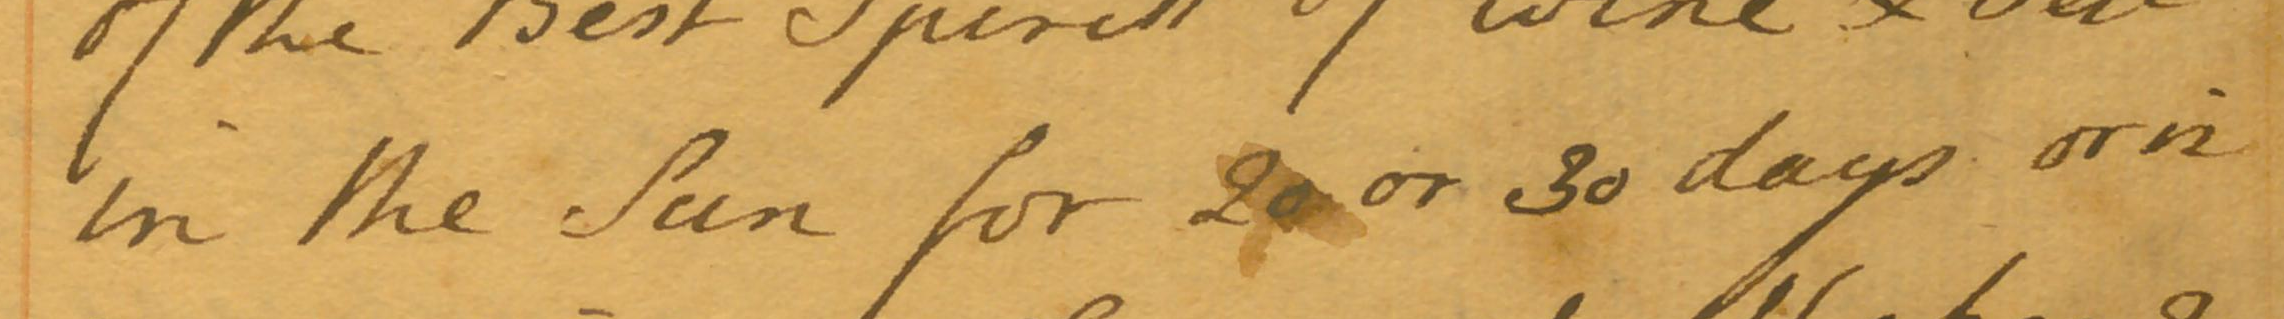in the sun for 20 or 30 days or in
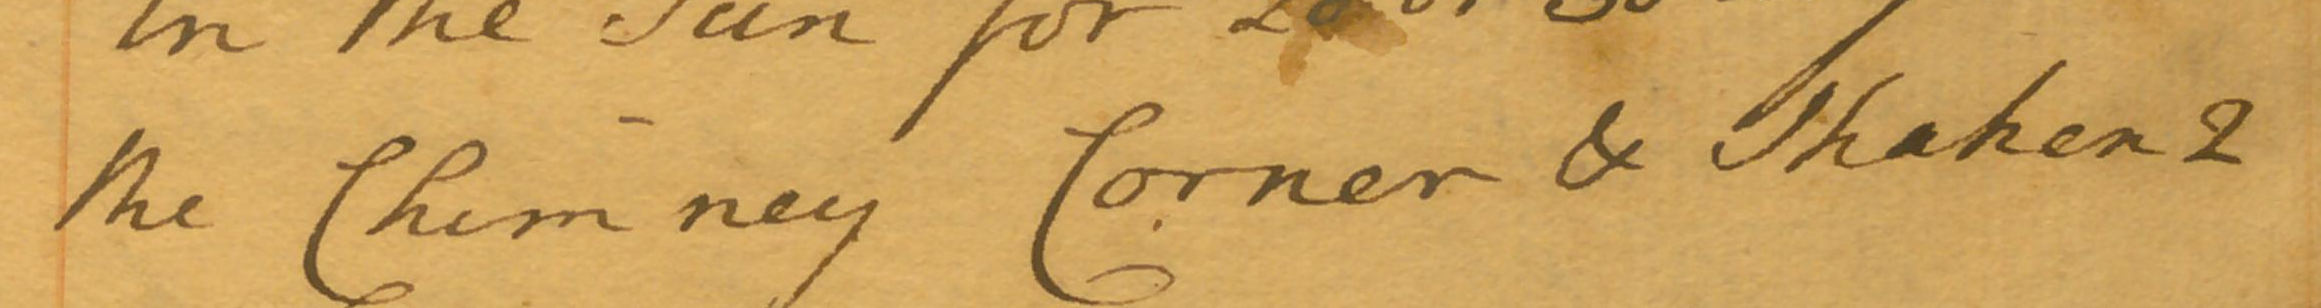the Chimney Corner & shaken 2
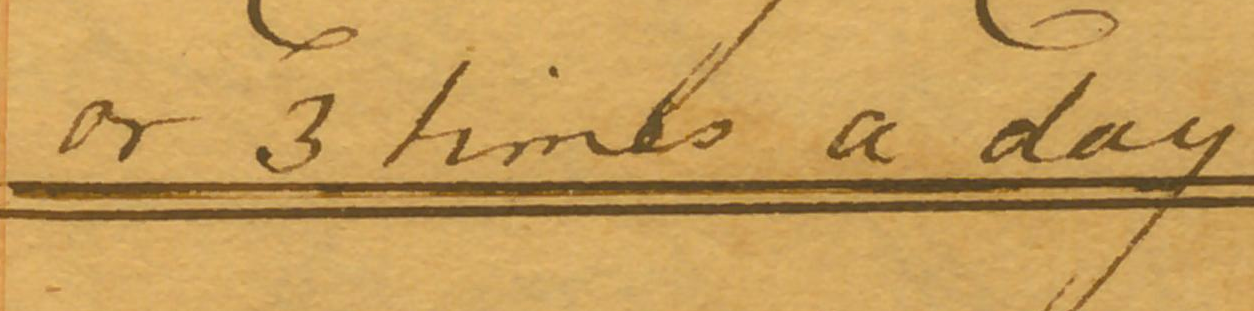or 3 times a day
